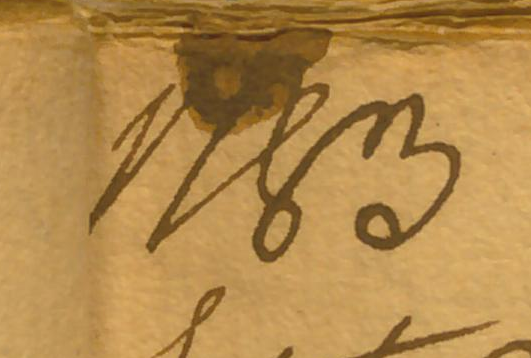1783
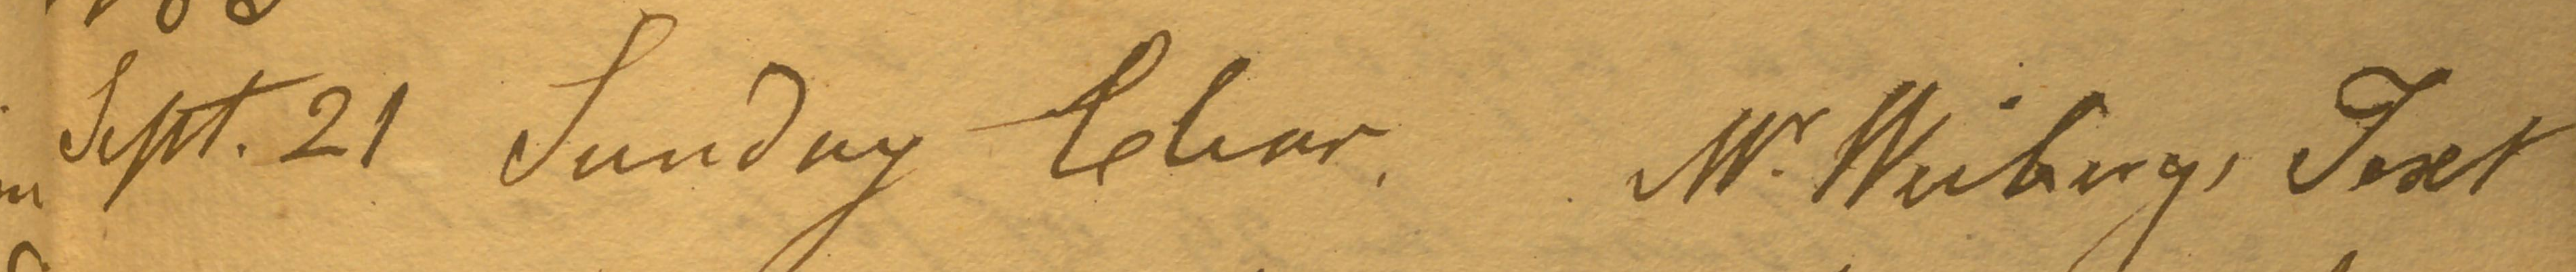Sept^r. 21t Sunday Clear. M^r. Weibergs Text
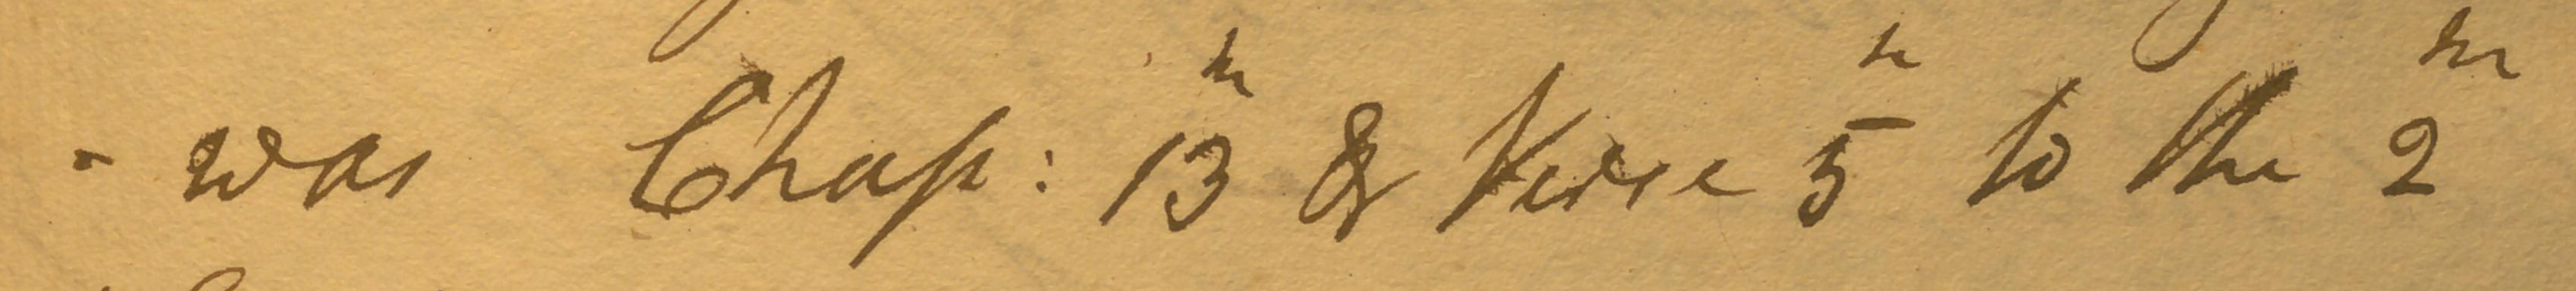was Chap: 13^th & Verse 5^th to the 2^th
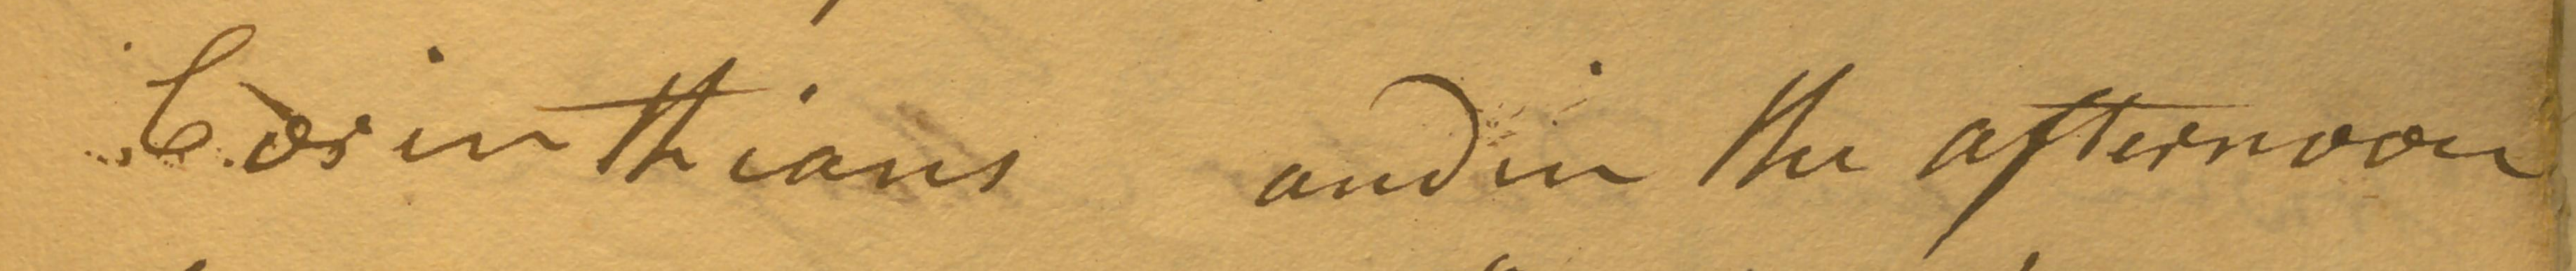Corinthians and in the afternoon
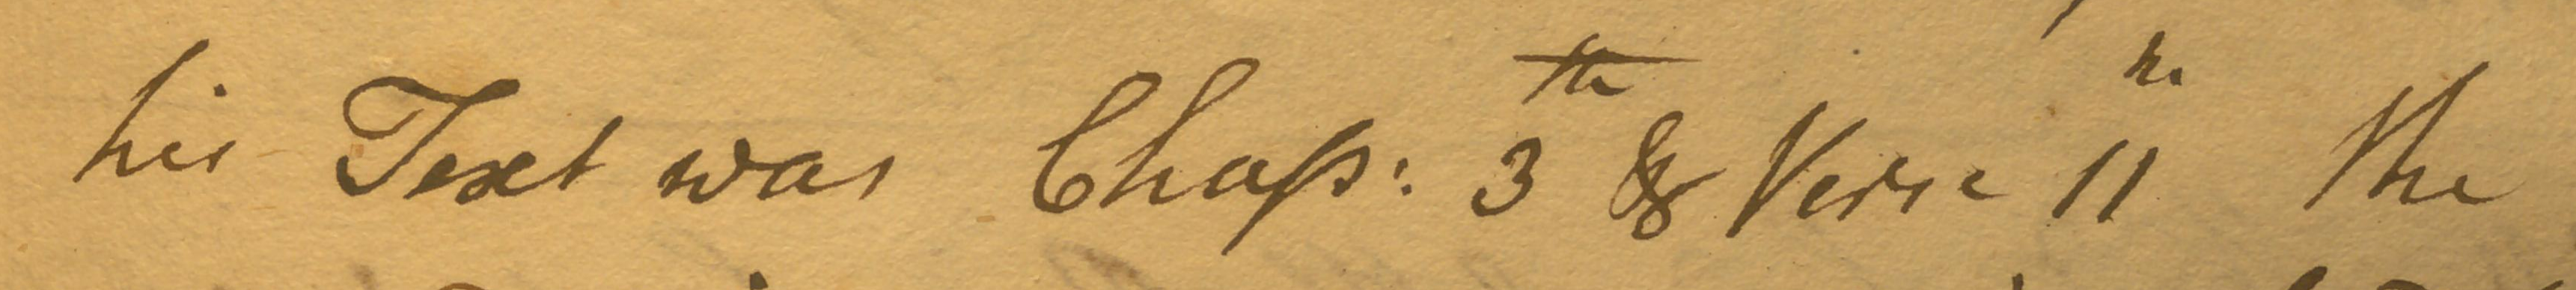his Text was Chap: 3^th & Verse 11^th the
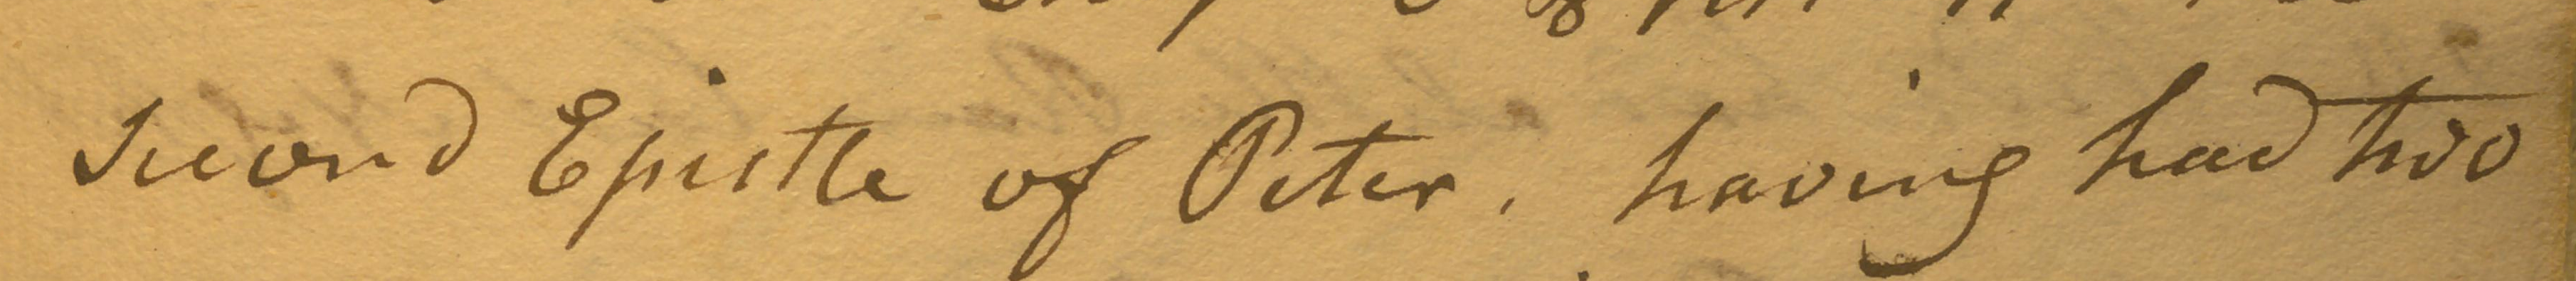second Epistle of Peter, having had two
